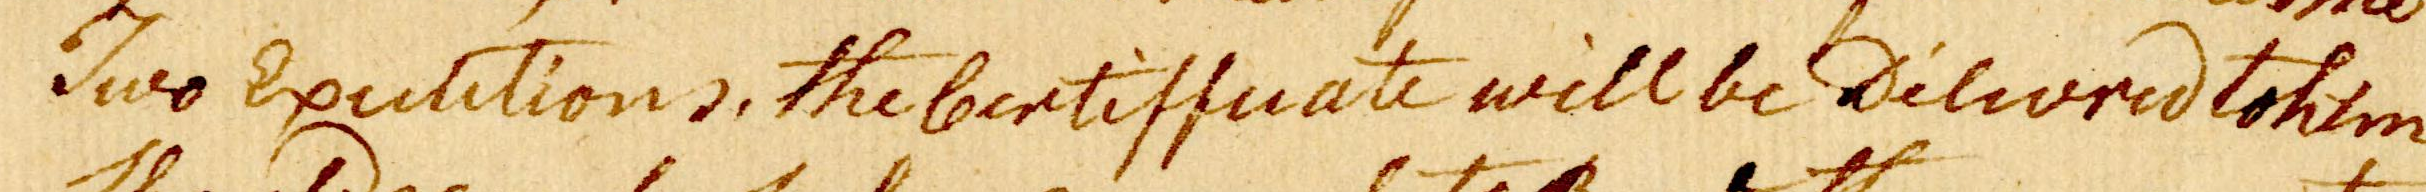Two Executions, the Certifficate will be Delivered to him
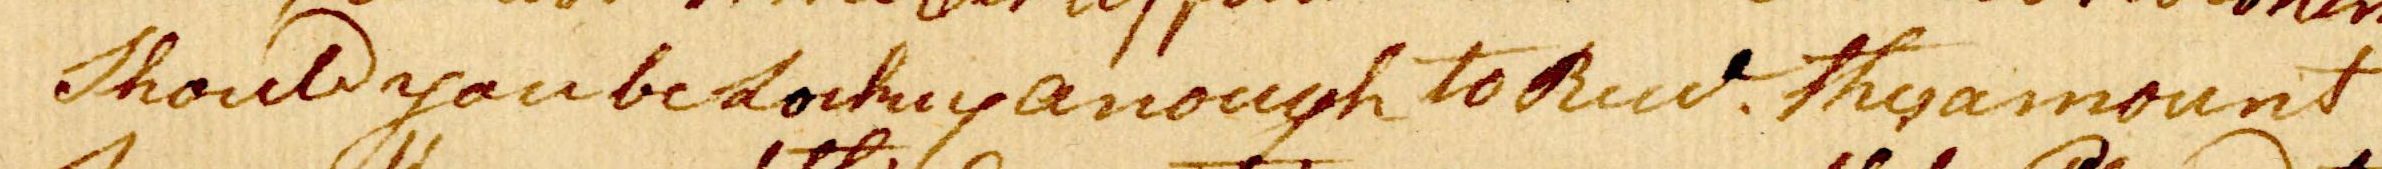should you be Lockey enough to Rece^e. the amount
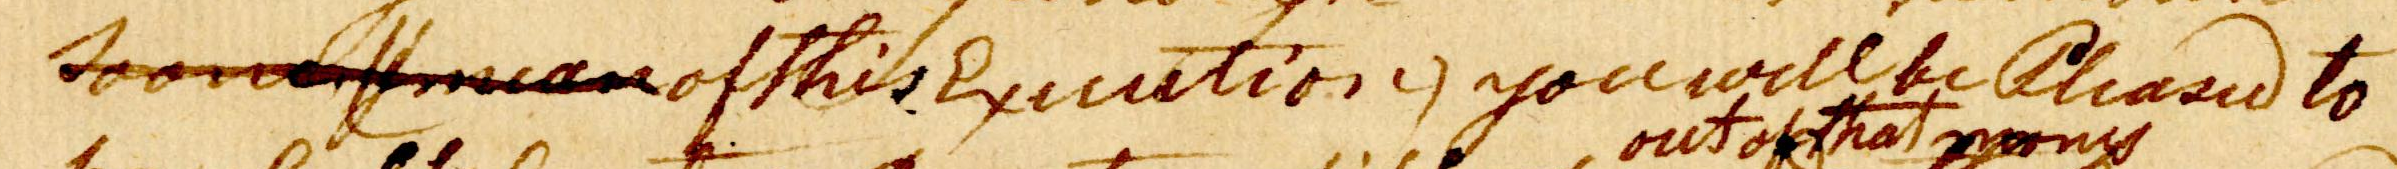[____________] of this Execution, you will be pleased to
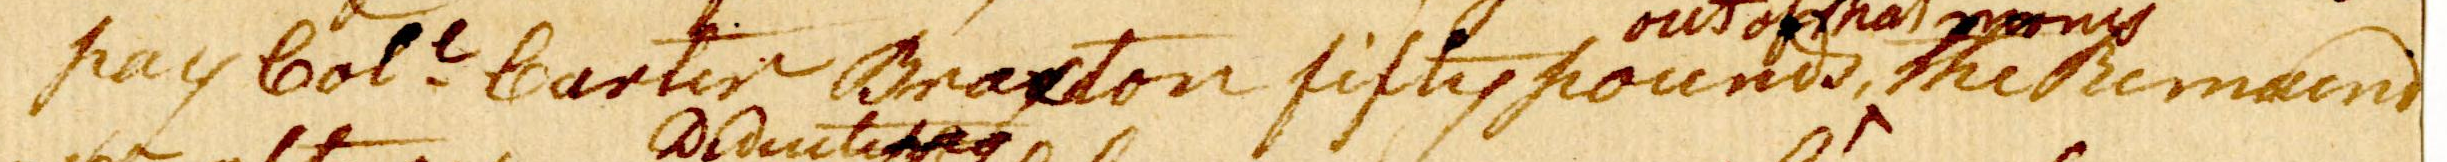pay Col^o. Carter Braxton fifty pounds, ^ the remaind
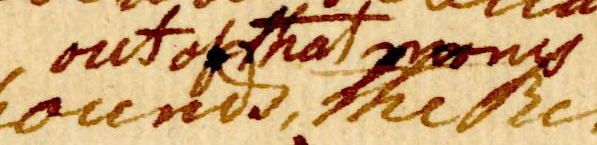out of that money
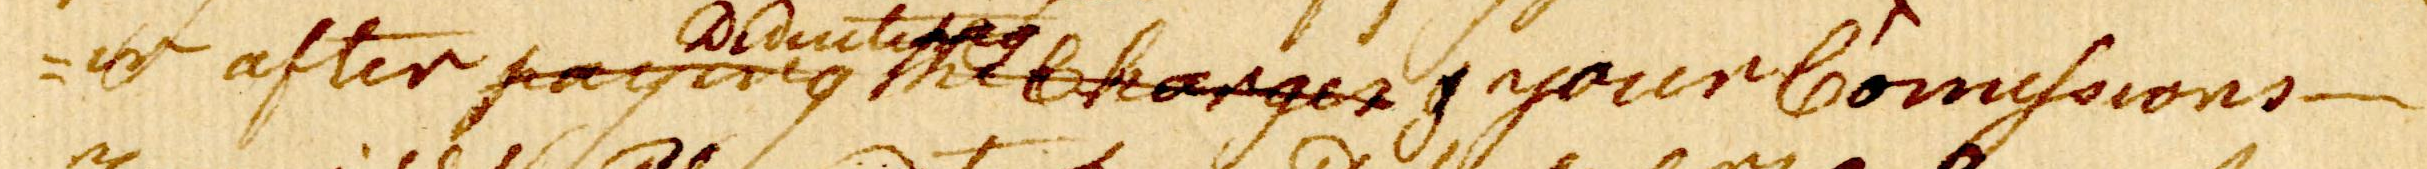-er after [paying the charges] & your Commissions-
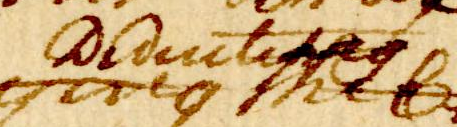Deducting
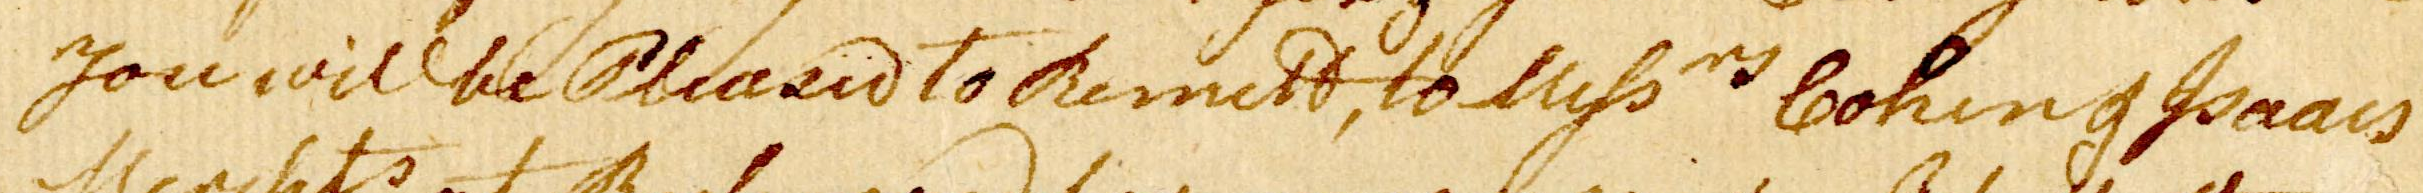you will be Pleased to Remitt to Mess^rs. Cohing Isaacs
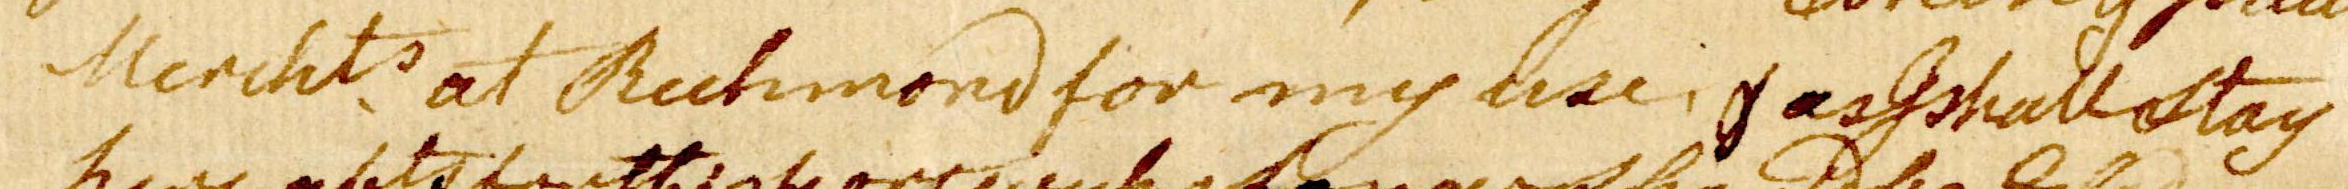Merch^ts. at Richmond for my care if as I shall stay
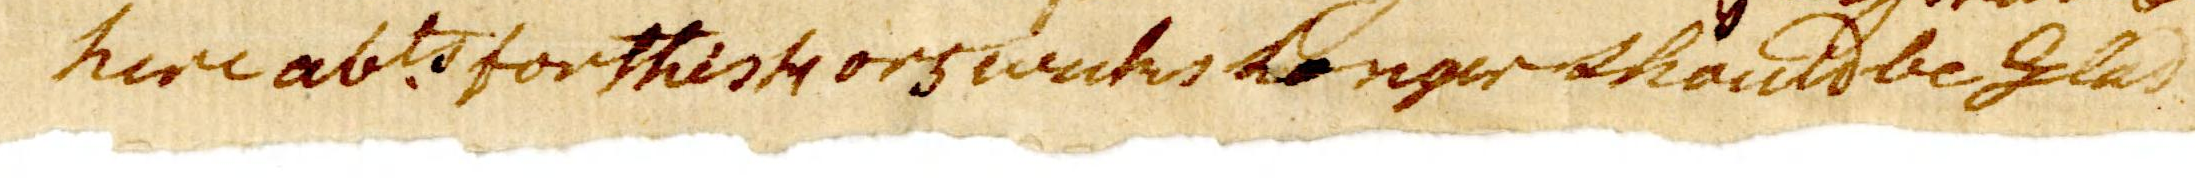here ab^ts. for this for 5 weeks longer should be glad
